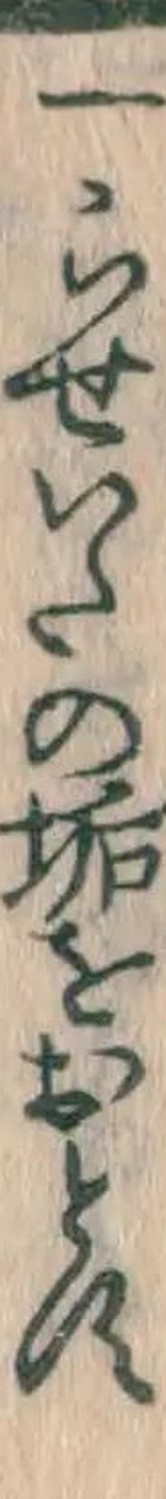一らせいたの垢をおとす
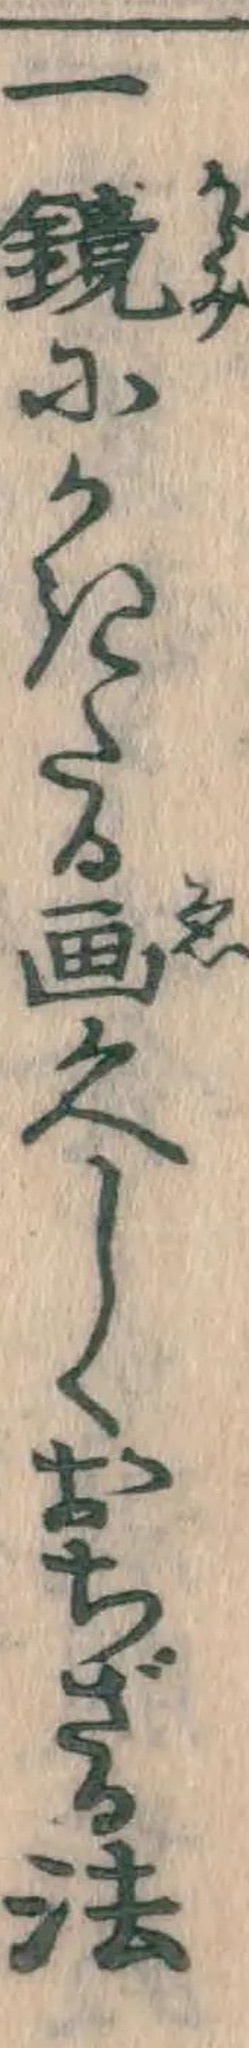一鏡にかきたる画久しくおちざる法
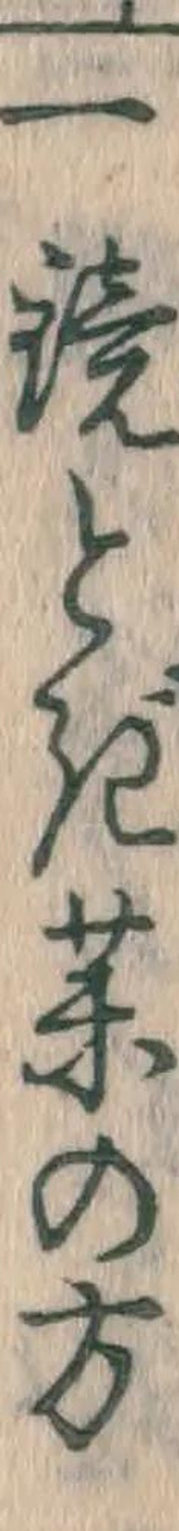一鏡とぎ薬の方
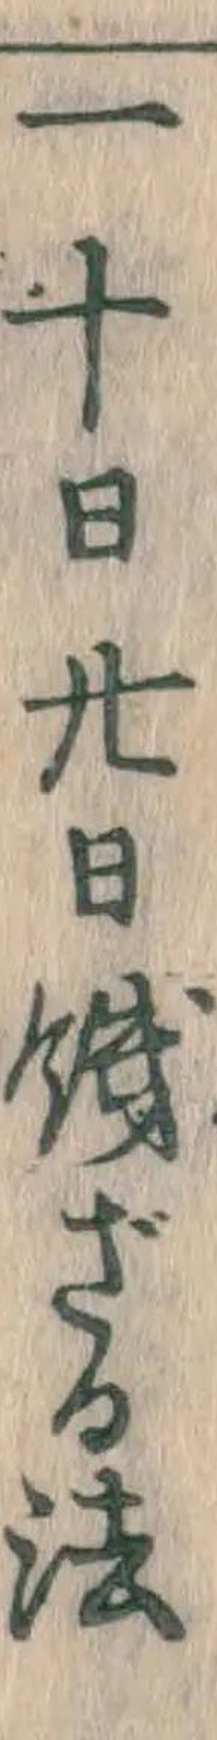一十日廿日饑ざる法
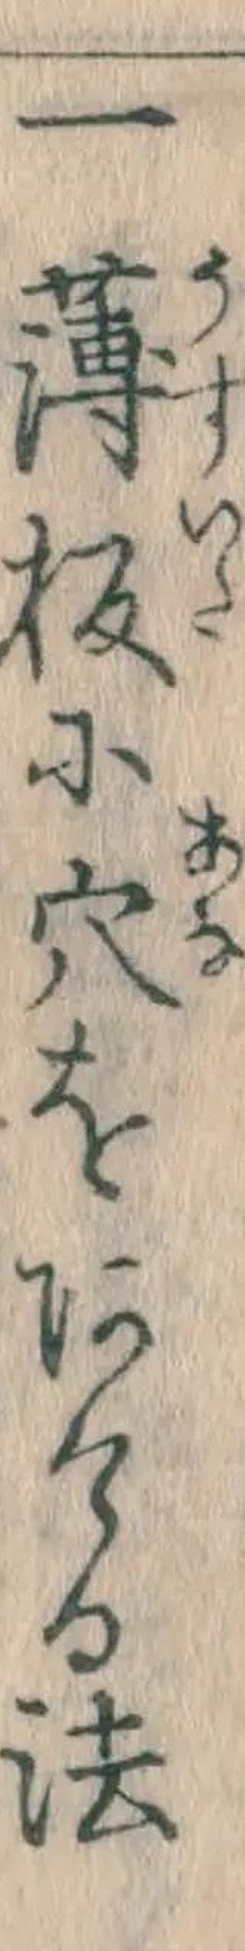一薄板に穴をあける法
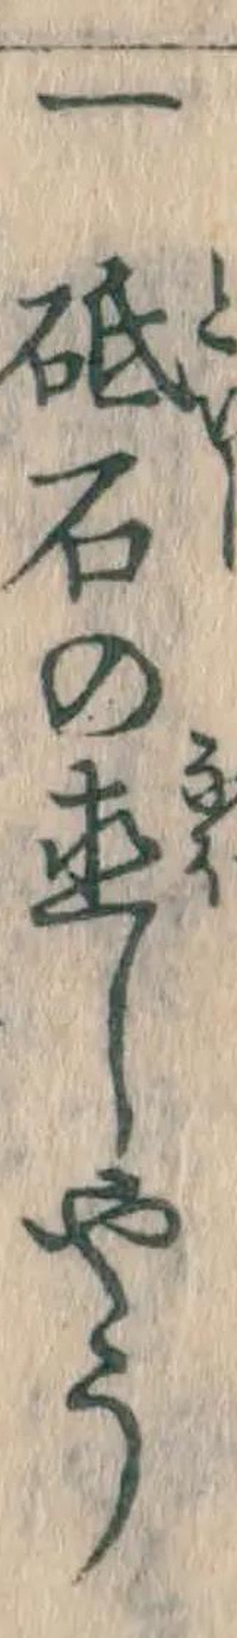一砥石の直しやう
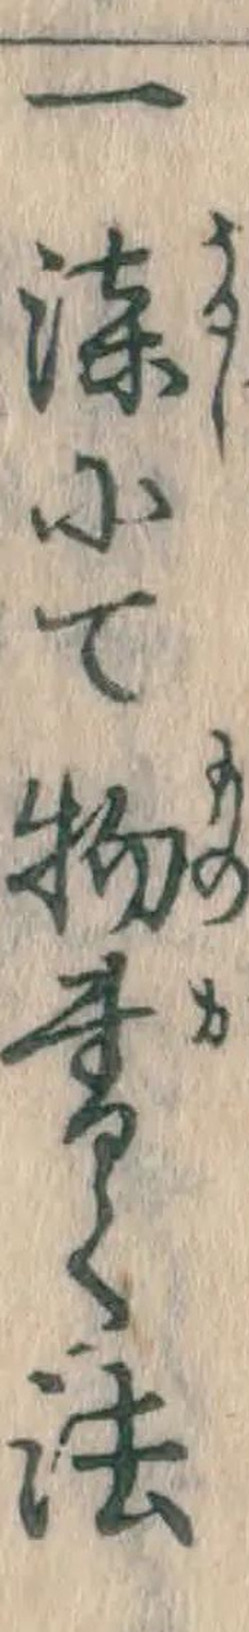一漆にて物書く法
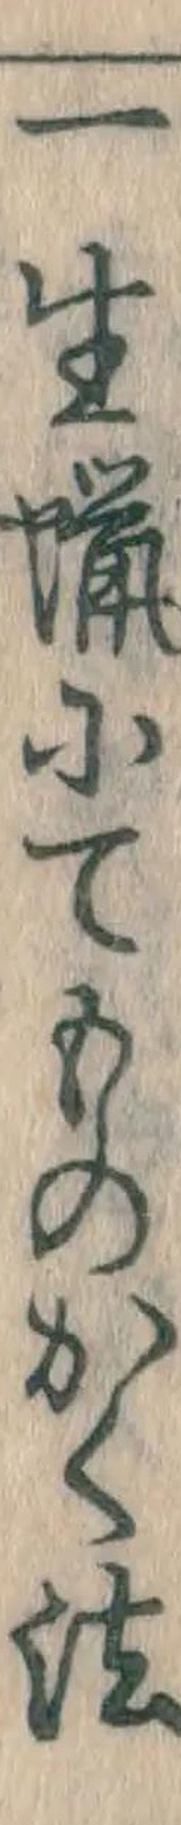一生蠟にてものかく法
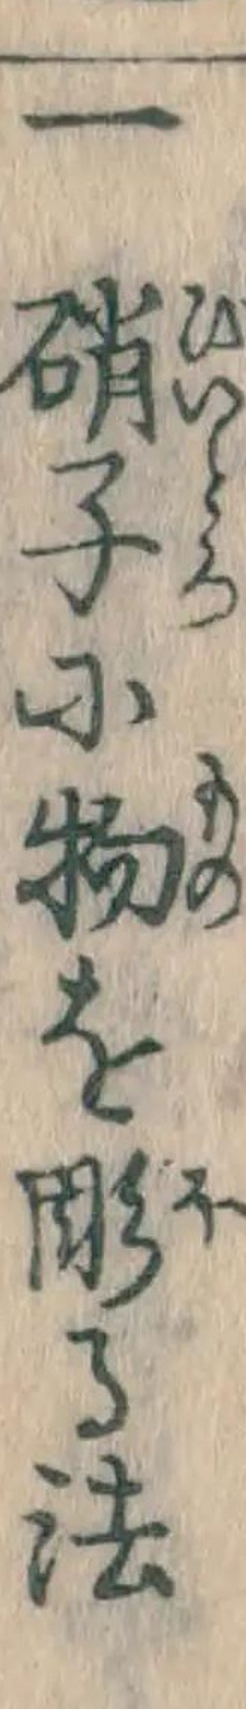一硝子に物を彫る法
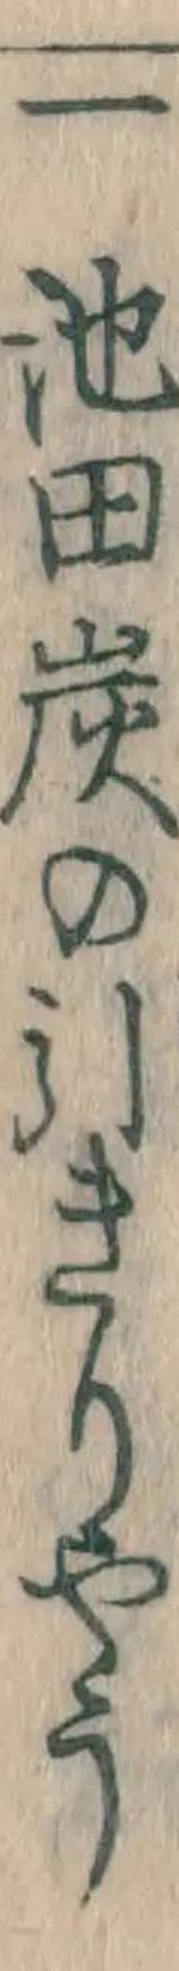一池田炭の引きりやう

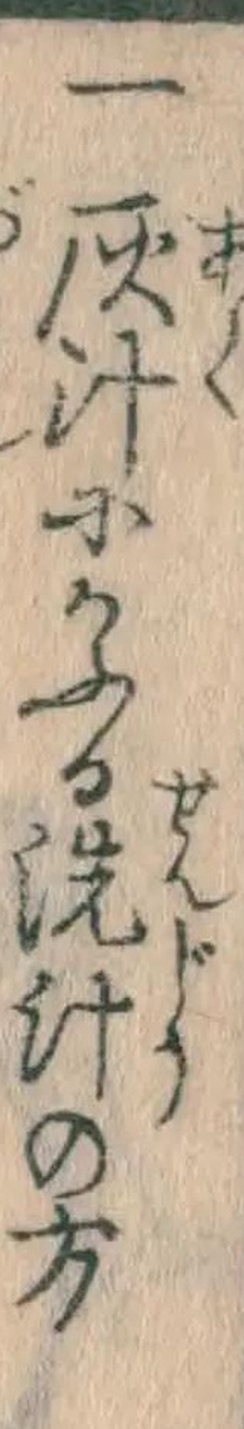一灰汁にかふる洗汁の方
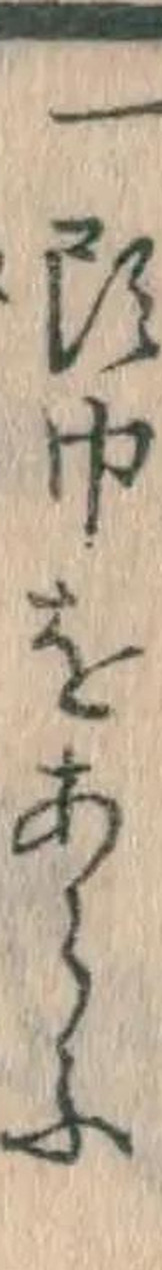一頭巾をあらふ
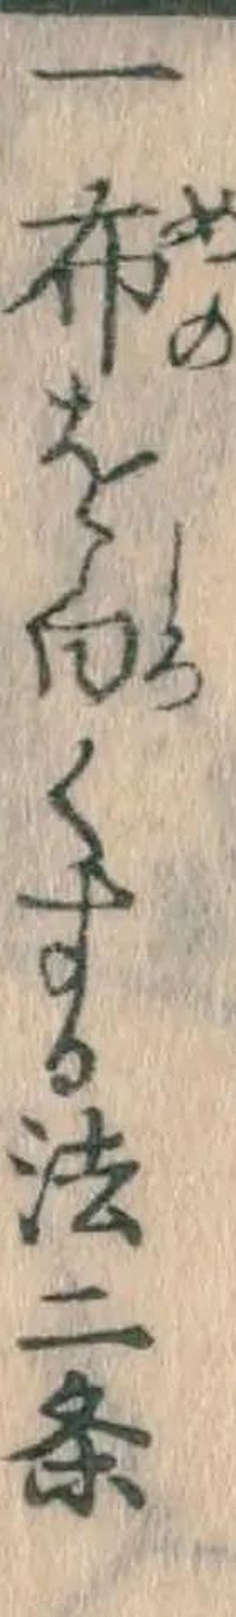一布を白くする法二条
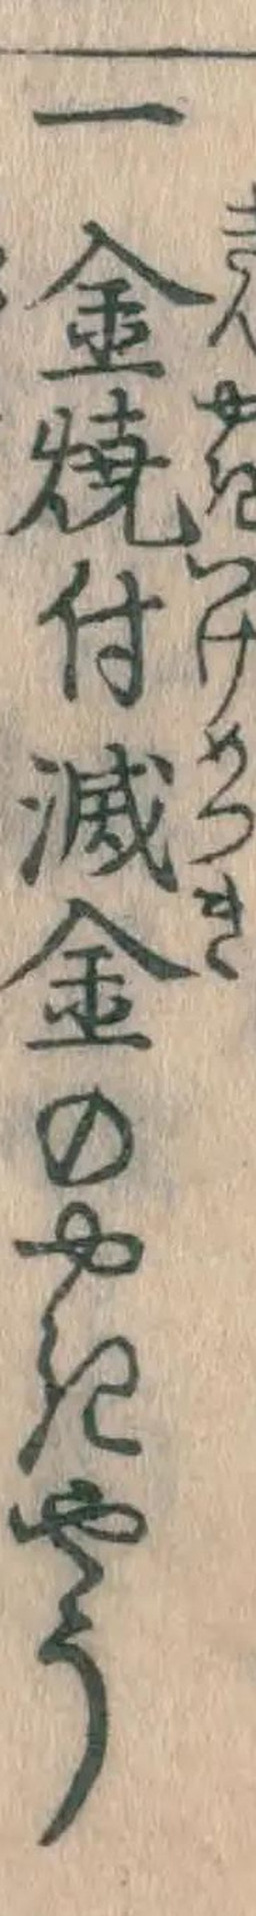一金焼付滅金のやきやう
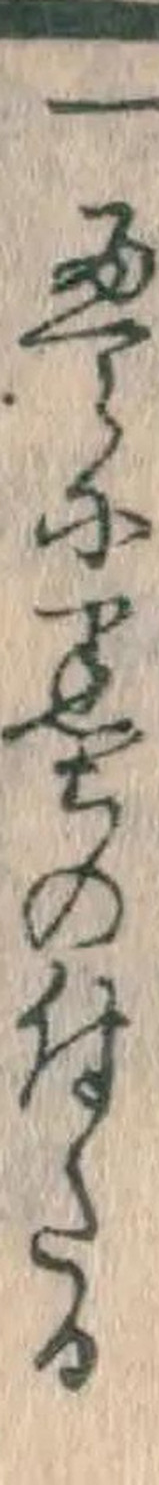一畳に墨の付たる
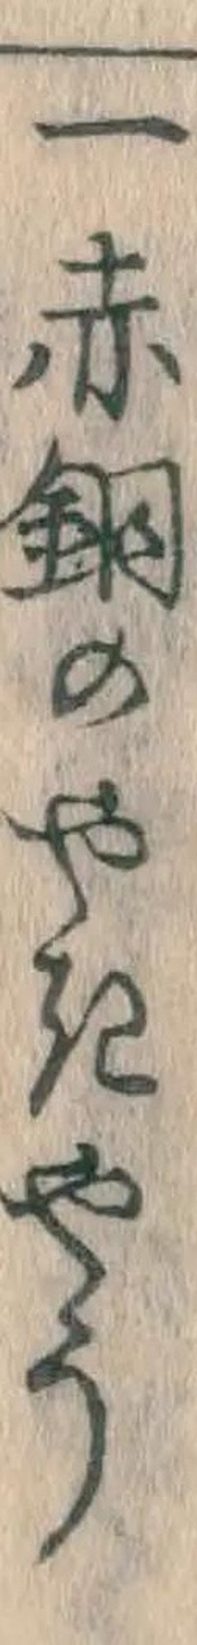一赤銅のやきやう
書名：広益秘事大全 3巻. [1]
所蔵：国立国会図書館 National Diet Library, JAPAN
